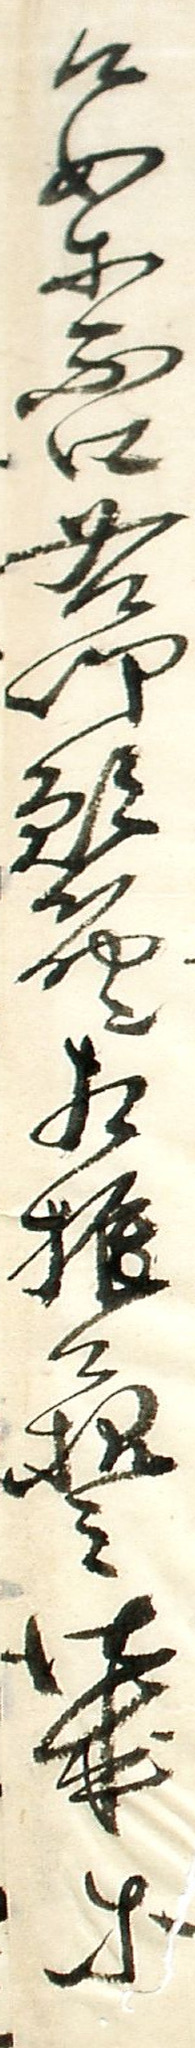候義等不仕右御願筋ニ相振候様之仕成等
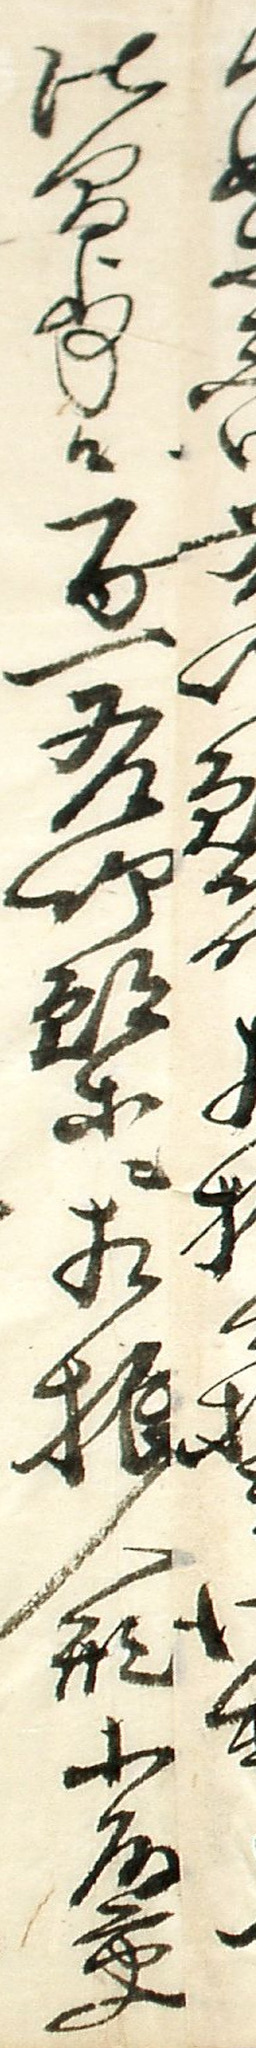仕間布候万一右御願等ニ相振人形等取交
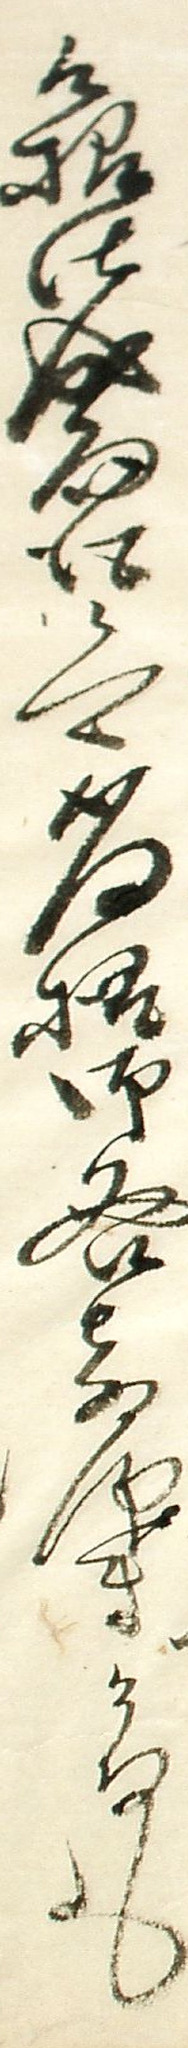候様仕成向仕候ハヽ如何様御咎被為仰付候而も
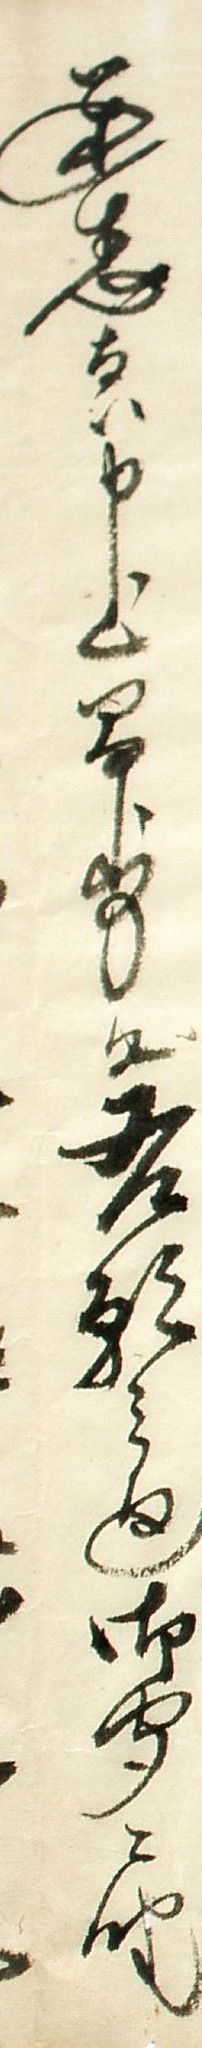迷惑とハ申上間布候右願之通御聞届
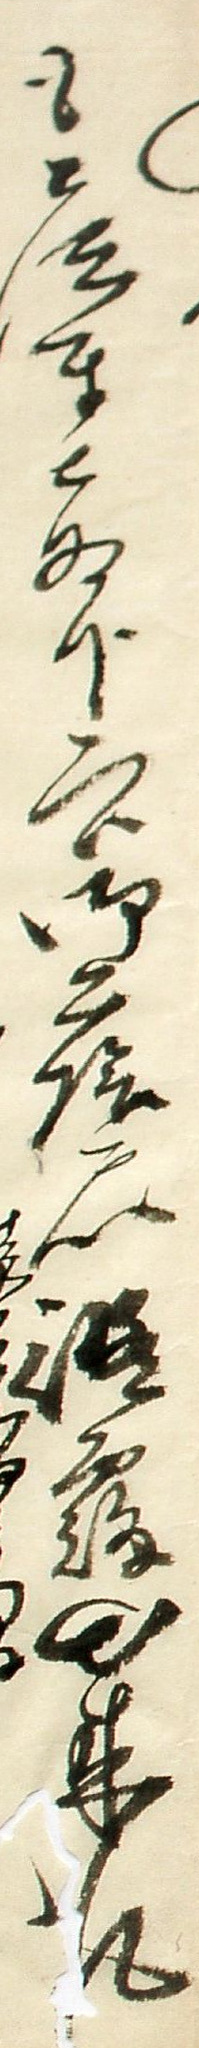も被仰付被為下候へハ御蔭を以修復出来仕
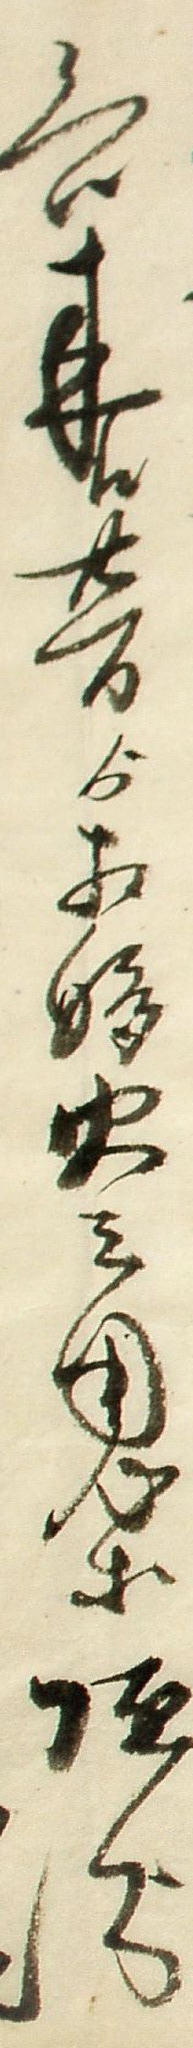候へハ来ル廿一日ゟ相始メ火之用心等随分
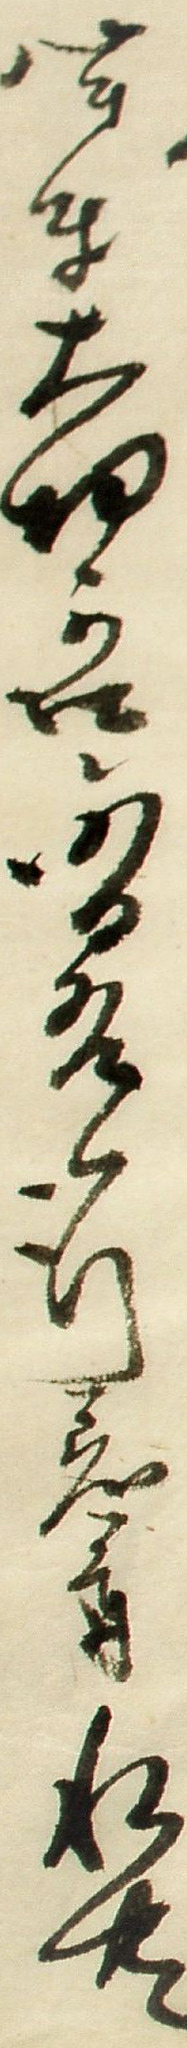心付奉大切可仕候仍而右御行着ニ付私共

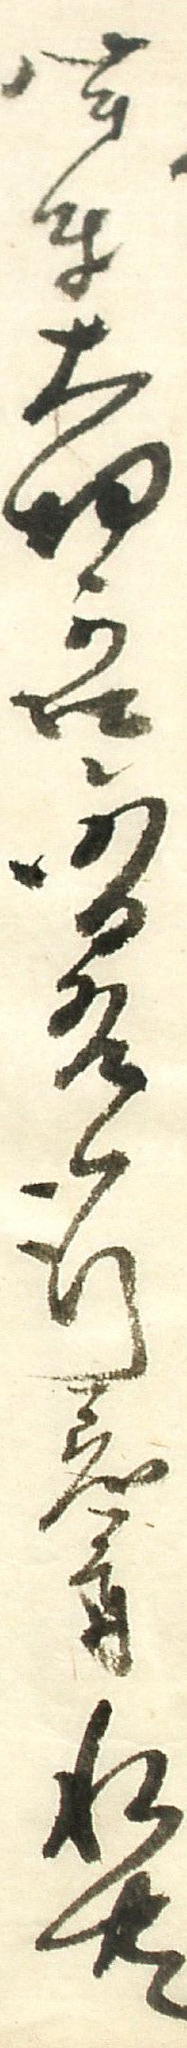心付奉大切可仕候仍而右御行着ニ付私共
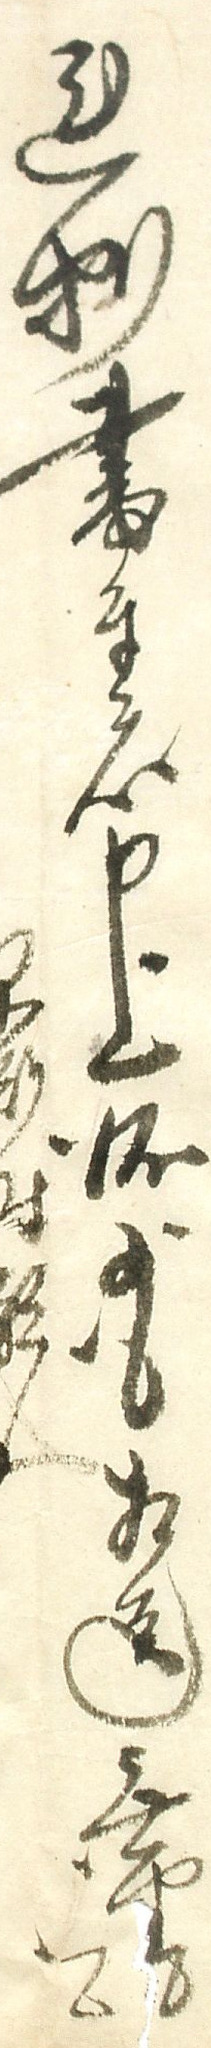連判書付ヲ以申上所少も相違無御坐候以上
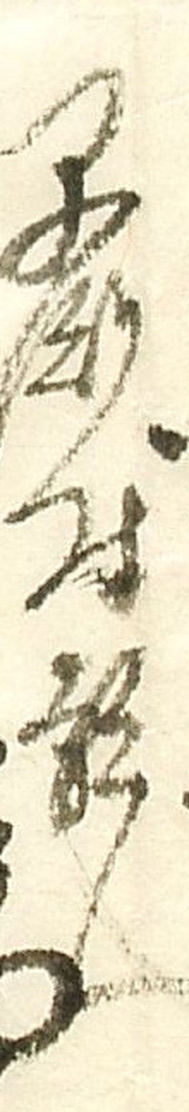早渕村願人
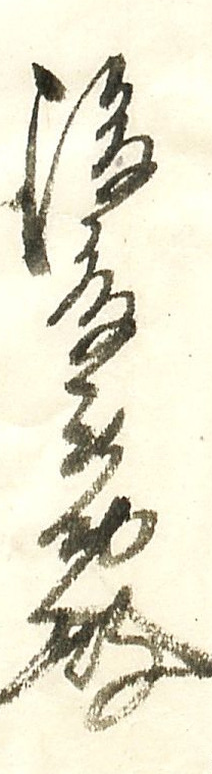後藤庄助殿
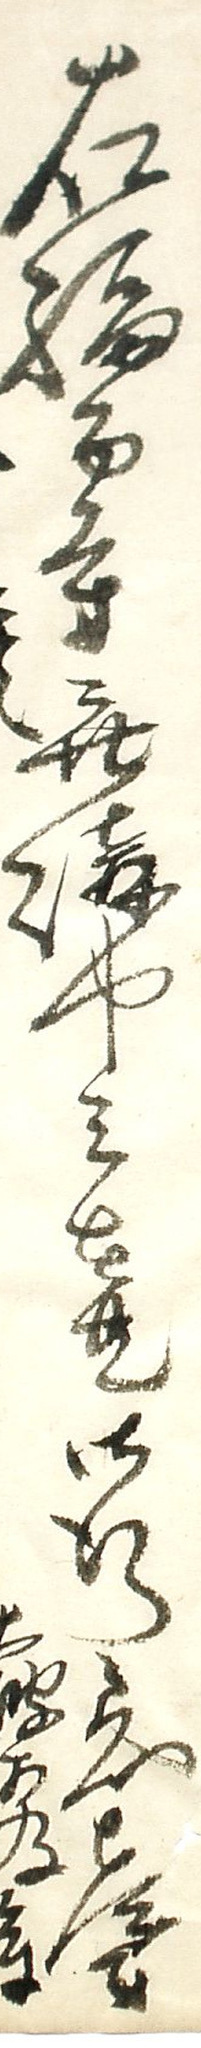右福万寺幷講中之者共御行着被仰付
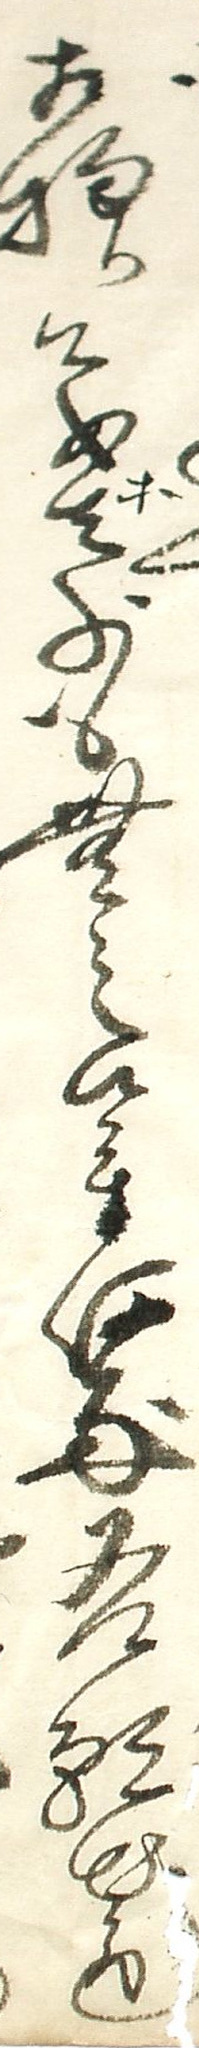相拘り候義等者少も無之候ニ付何卒右願出通
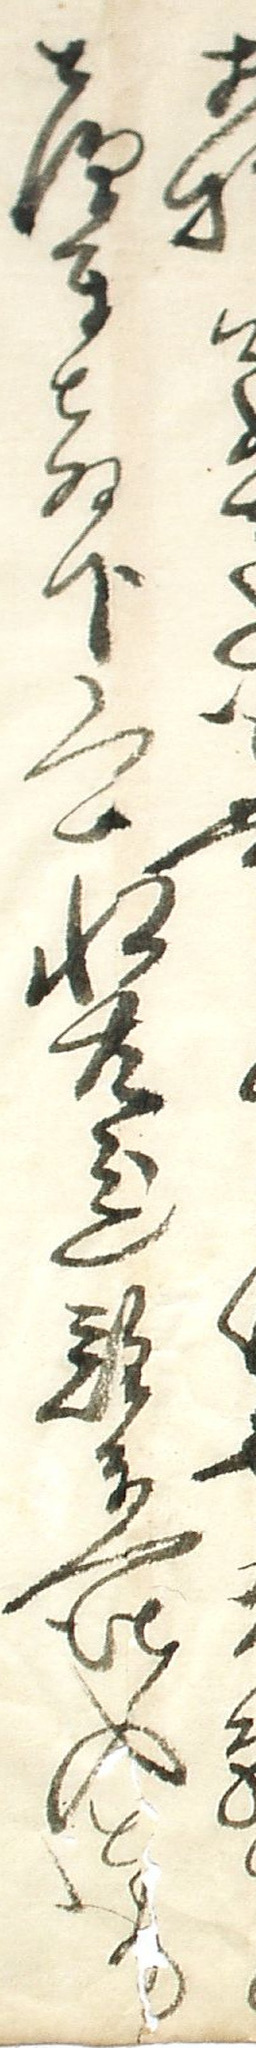被仰付被為下候へハ私共迄難有仕合奉存候
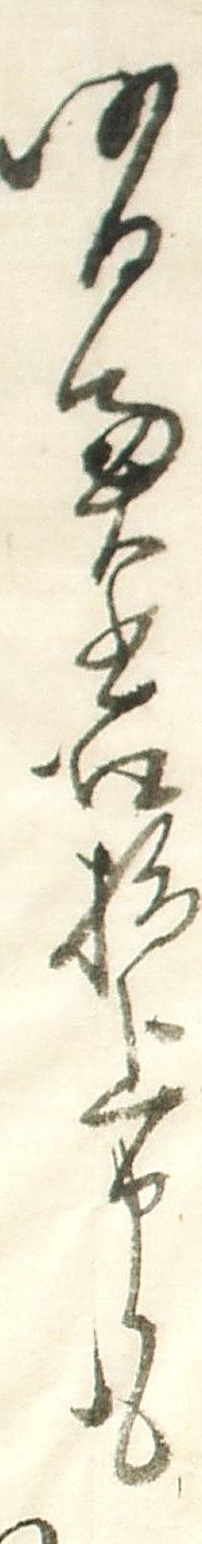仍而奥書仕指上申候以上
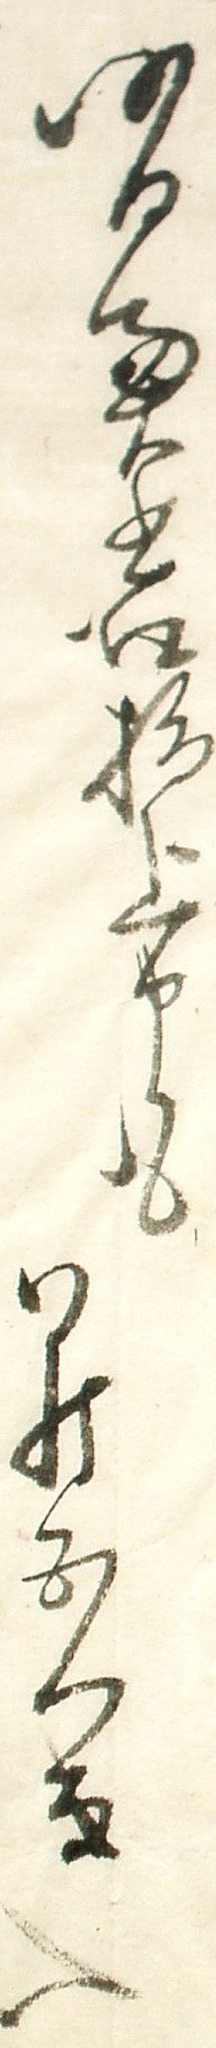仍而奥書仕指上申候以上
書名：(早渕村福満寺子ども浄瑠璃願紙面）他
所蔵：鳴門教育大学 Naruto University of Education
